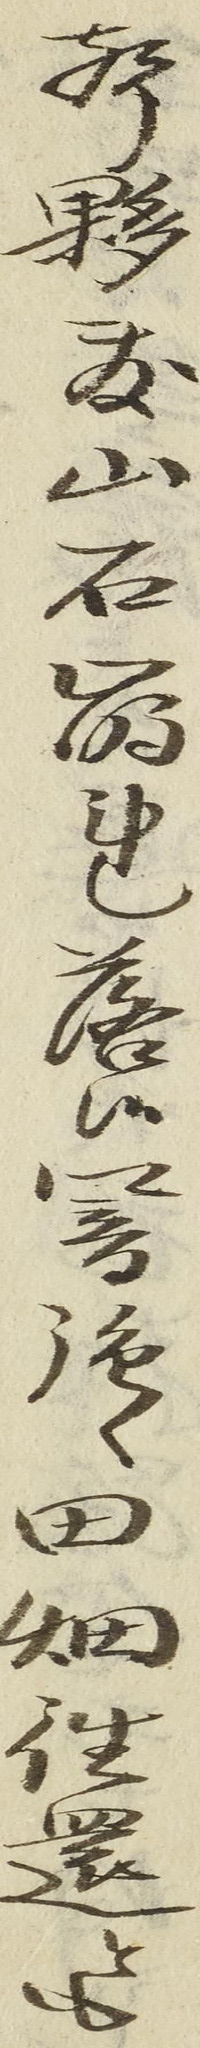声夥敷山石崩落候響強く田畑往還とも
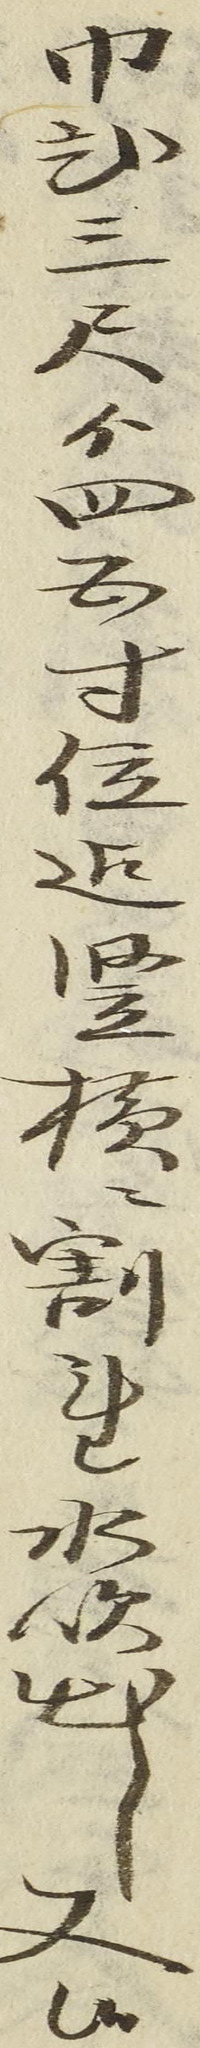巾弐三尺ゟ四五寸位迄竪横二割れ水吹出し又候
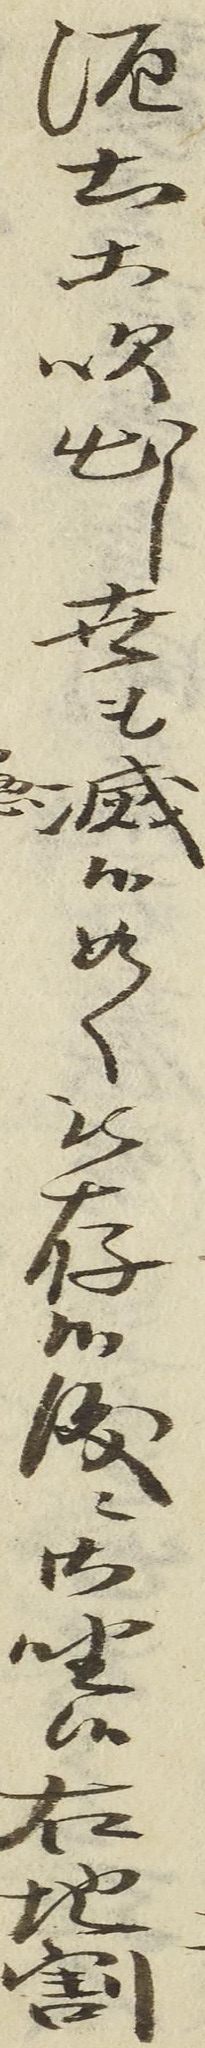泥土等吹出し世も減候如く被存候儀二御坐候右地割
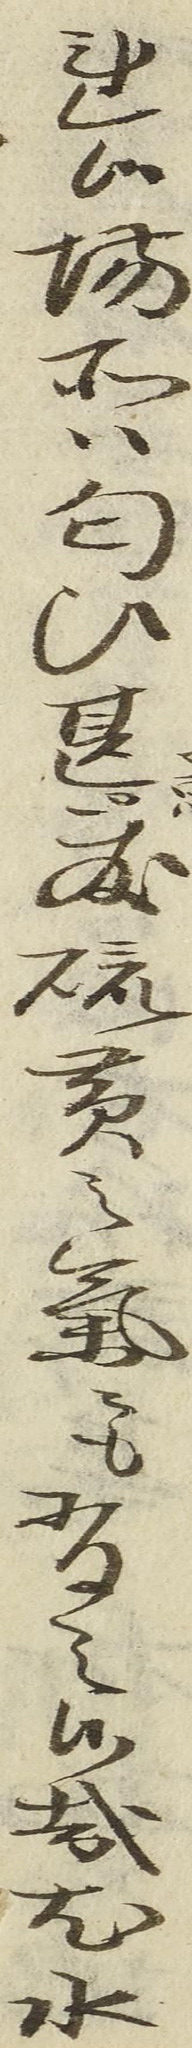れ候場所は匂ひ甚悪敷硫黄之気二も有之候哉尤水
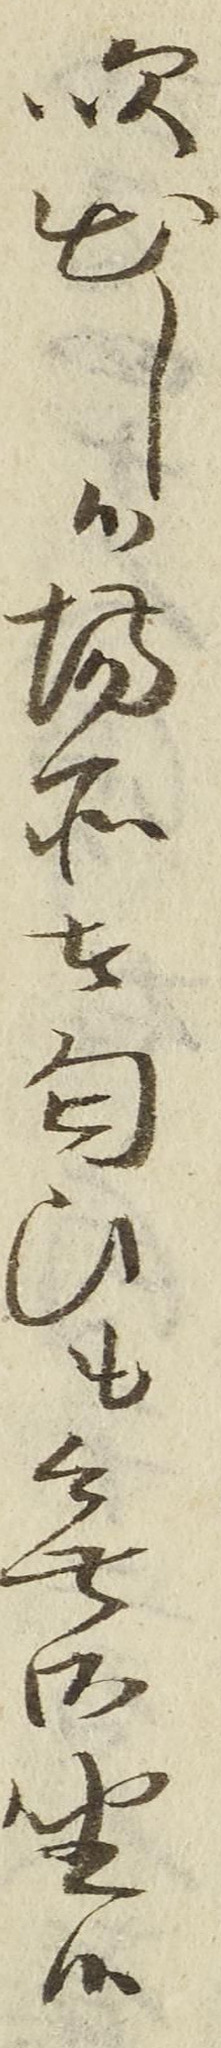吹出し候場所は匂ひ無御坐候
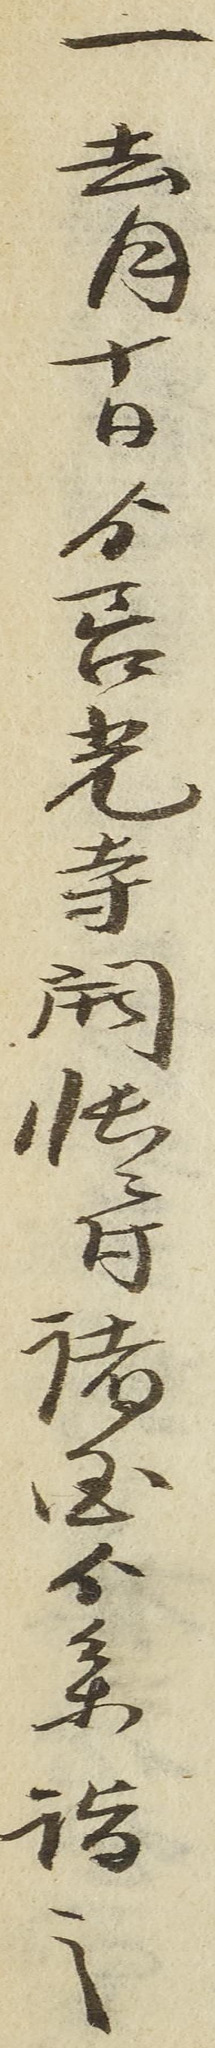一去月十日ゟ善光寺開帳二付諸国ゟ参詣之

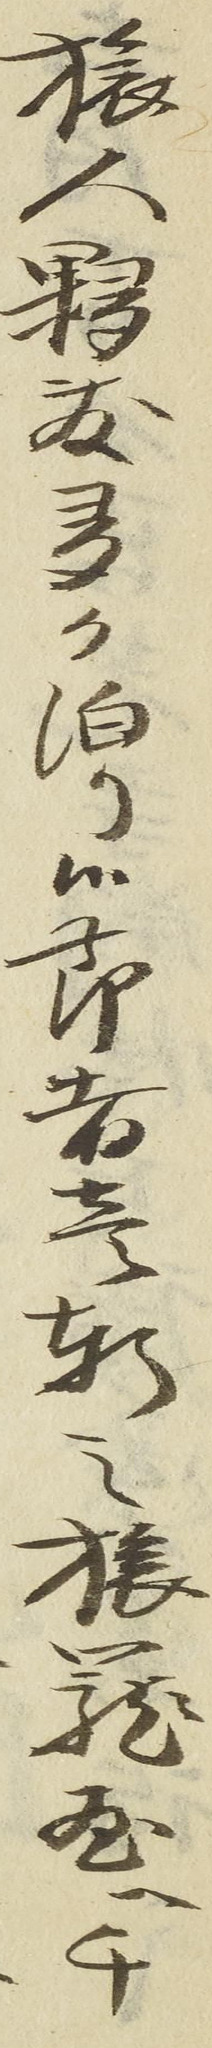旅人夥敷多ク泊り候節は壱軒之旅籠屋へ千
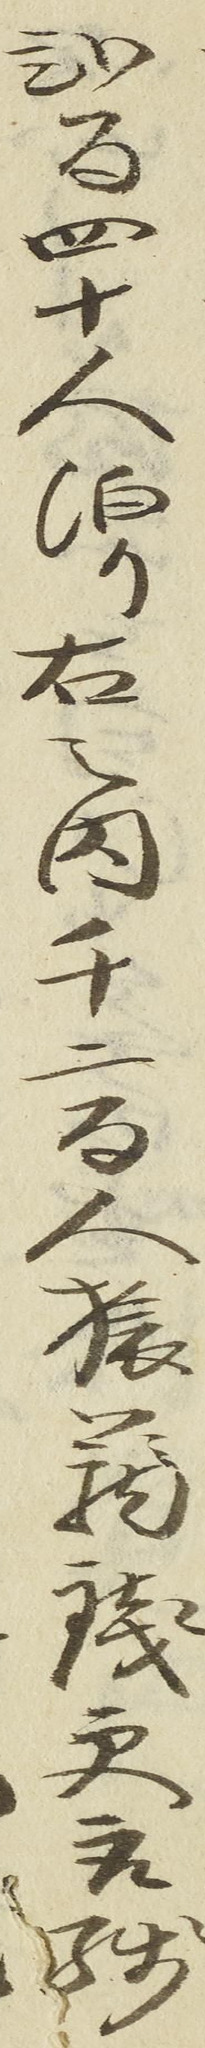弐百四十人泊り右之内千二百人旅籠銭受取残
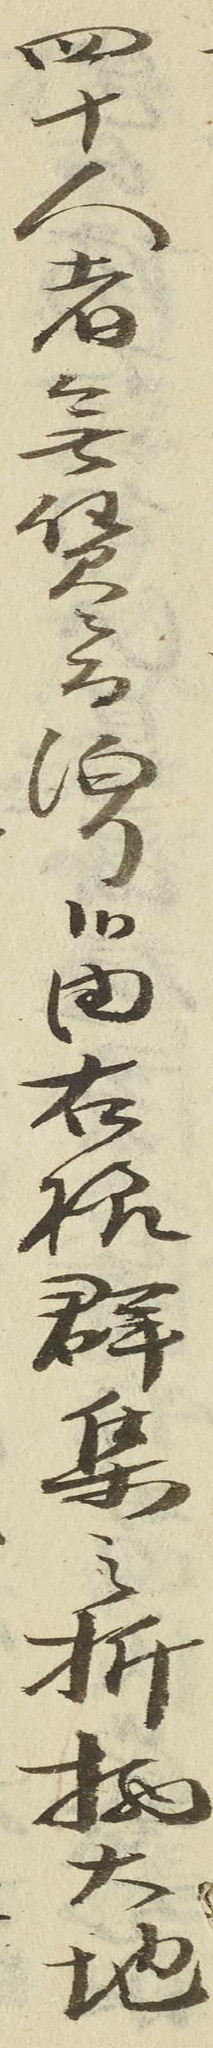四十人は無賃二而泊り候由右様群集之折柄大地
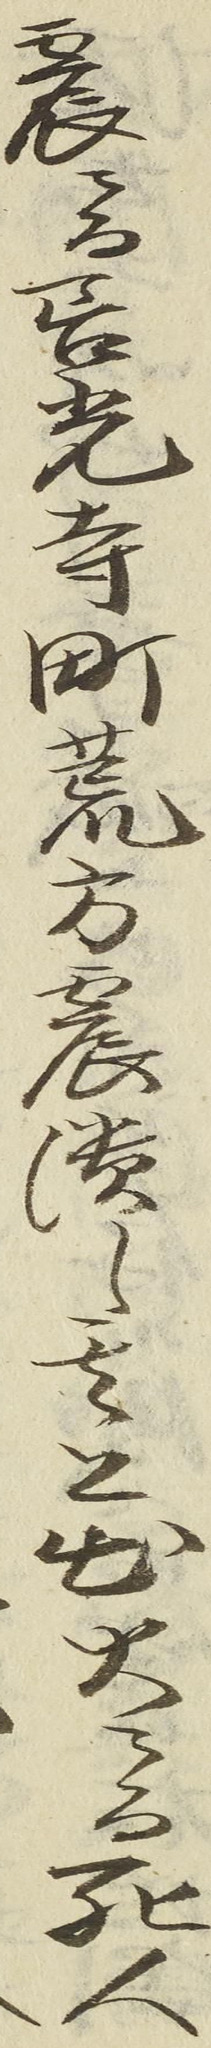震二而善光寺町荒方震潰し其上出火二而死人
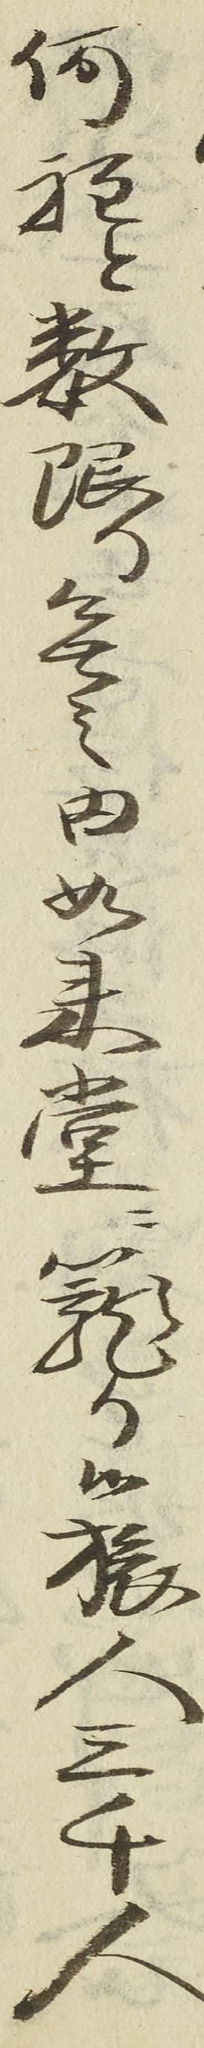何程と数限り無之由如来堂ㇸ籠り候旅人三千人
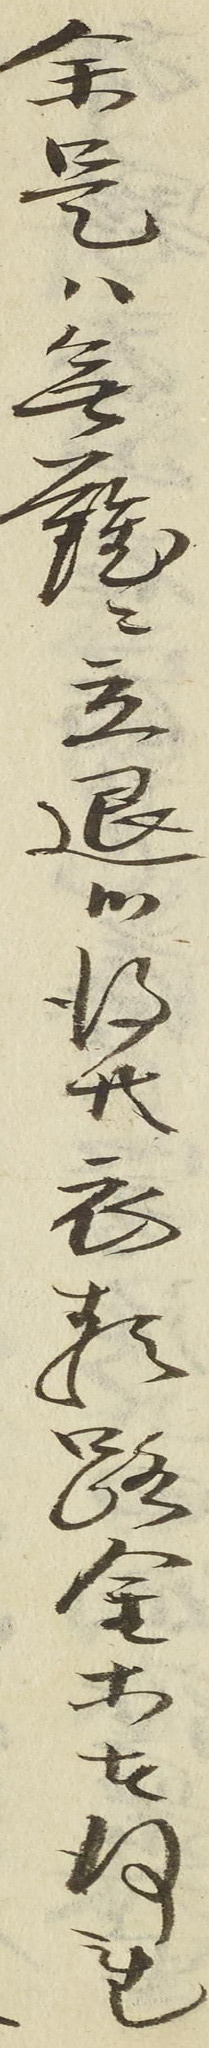余是ハ無難二立退候得共衣類路金等は何れ
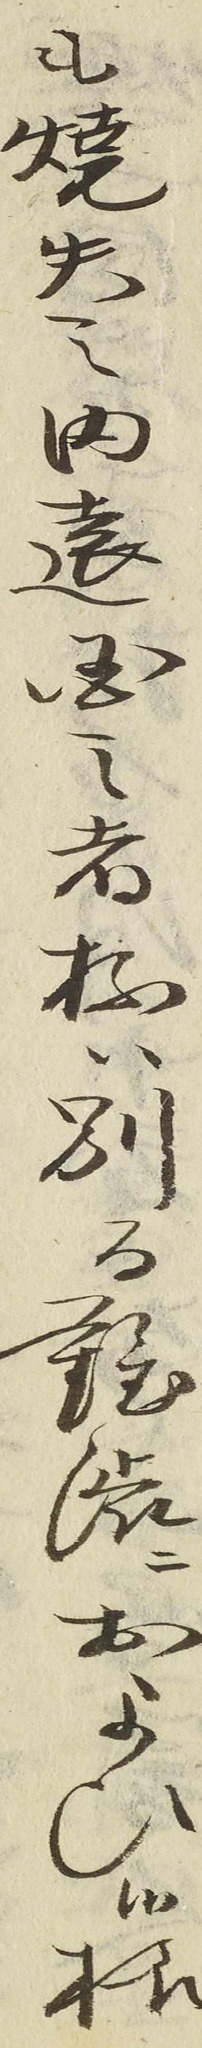も焼失之由遠国之者抔ハ別而難渋二および候様
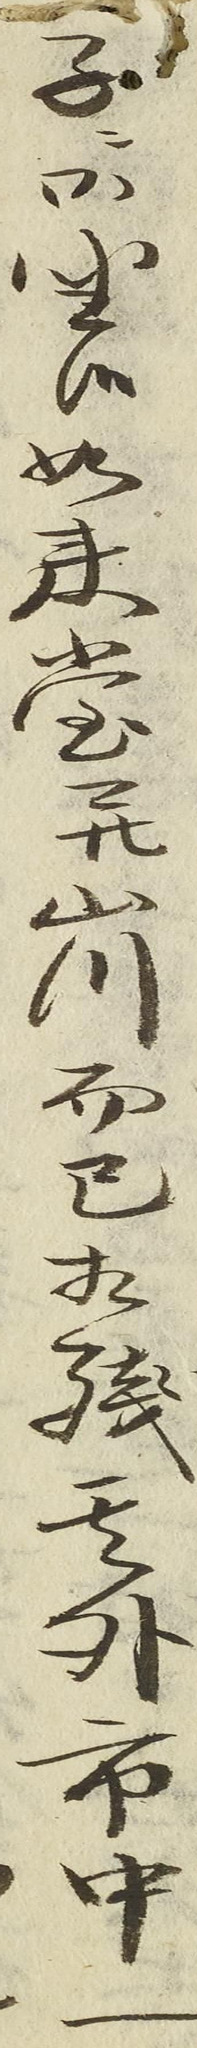子二御坐候如来堂并山川而已相残其外市中一
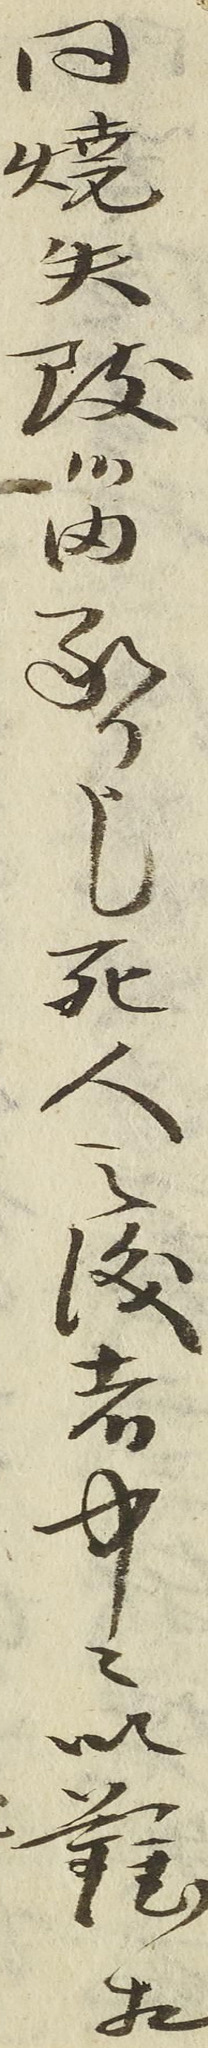同焼失致候由承り申候死人之儀は中々以難相
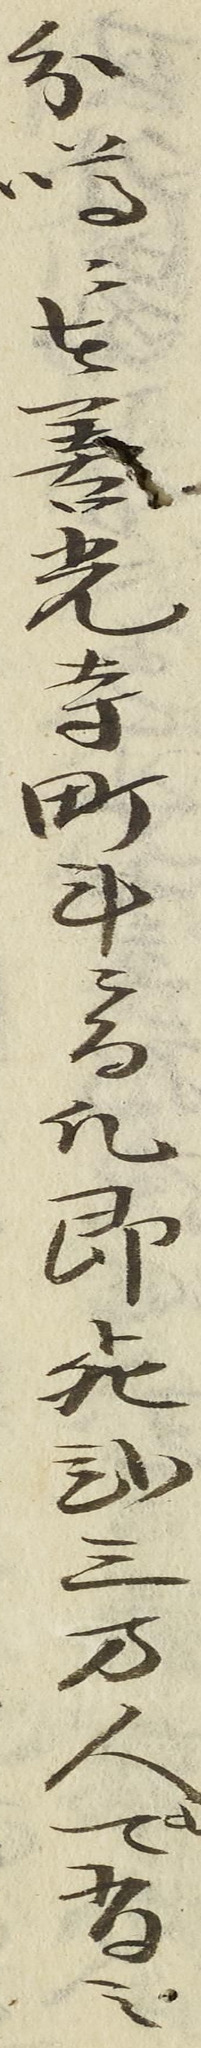分噂二は善光寺町斗二而凡即死弐三万人も可有之
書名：信濃國大地震記　乾
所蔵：東京大学地震研究所図書室 Earthquake Research Institute Library, The University of Tokyo, JAPAN
